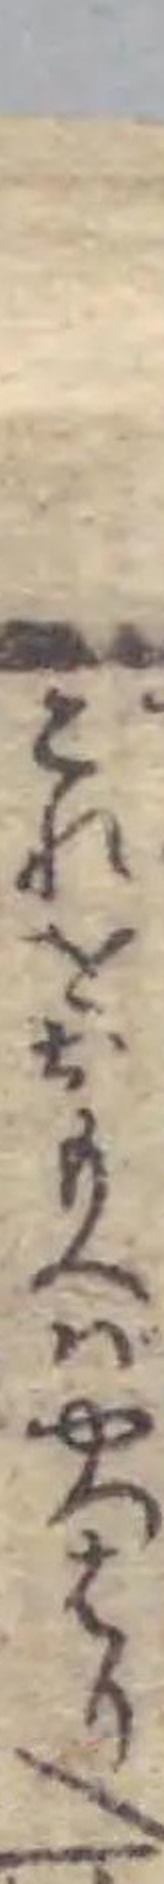これをおもへばやつはり
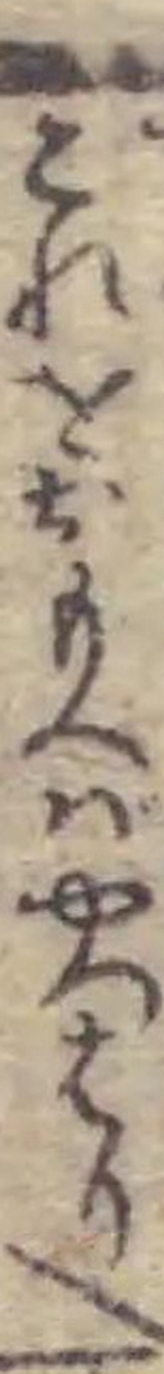これをおもへばやつはり
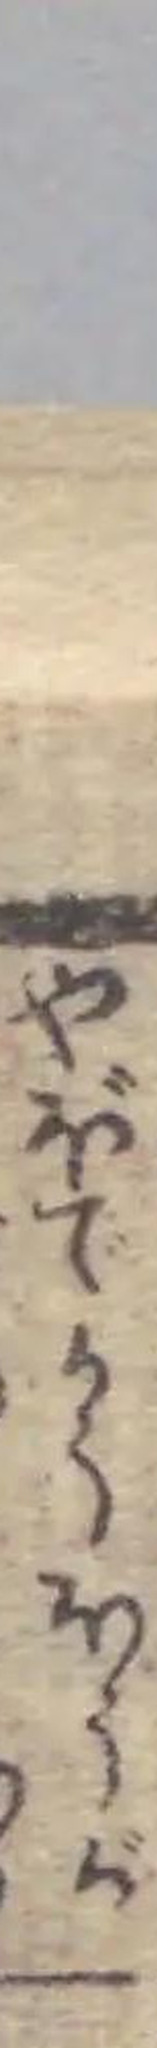やぼでかうほうが
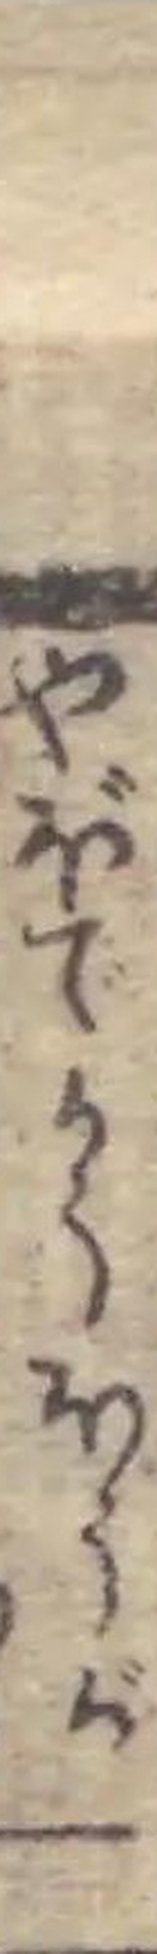やぼでかうほうが
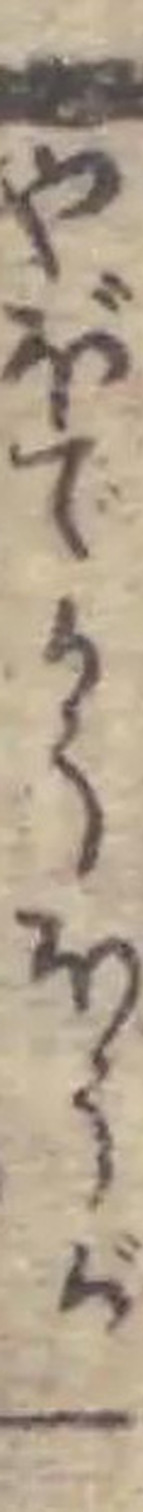やぼでかうほうが
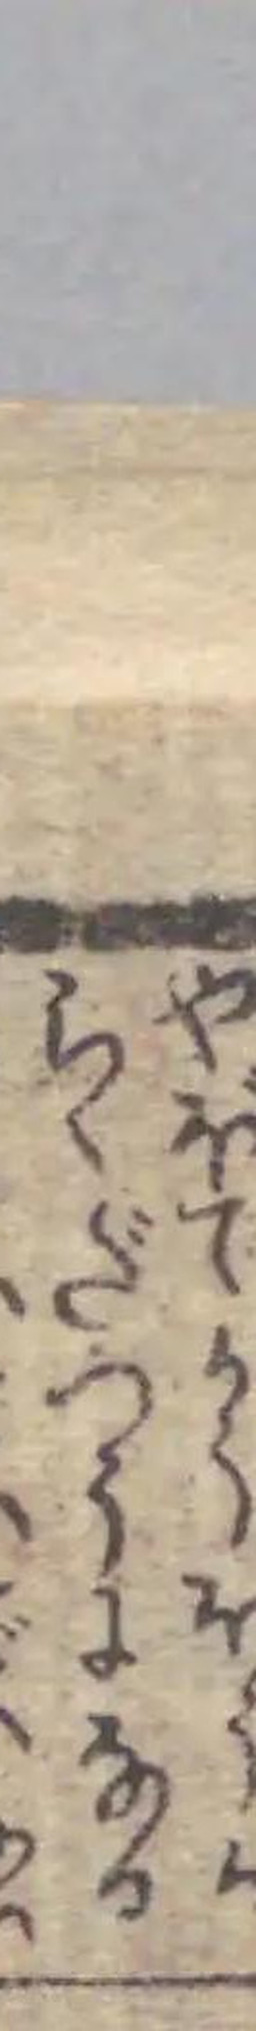らくだつうになる
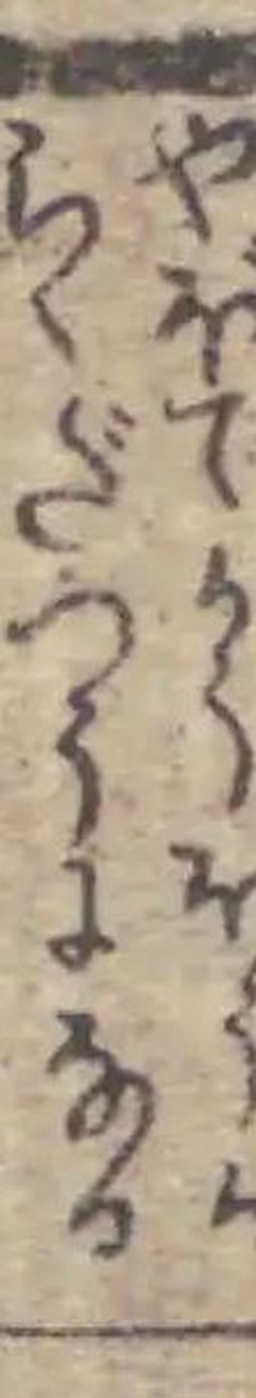らくだつうになる
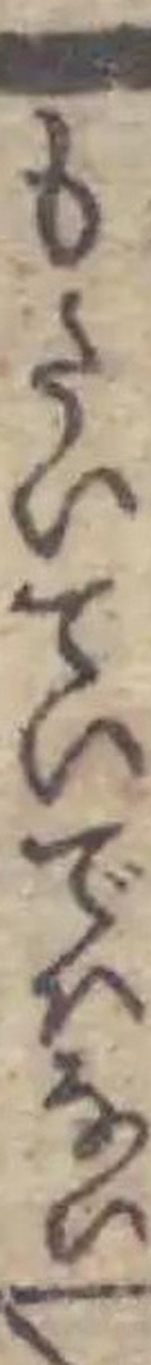もたいていではない
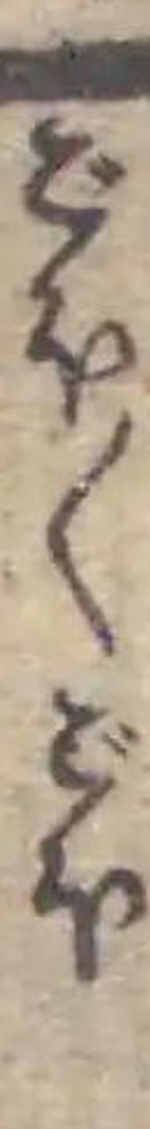ごほ〳〵ごほ

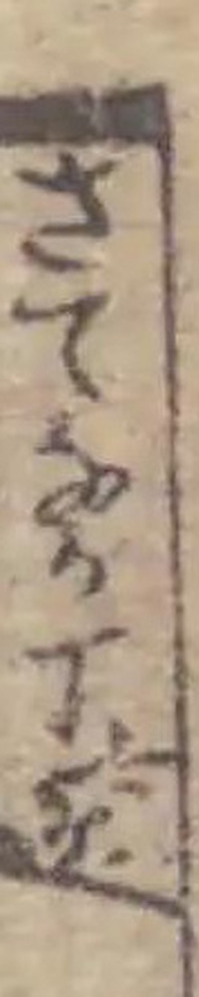さてなか丁
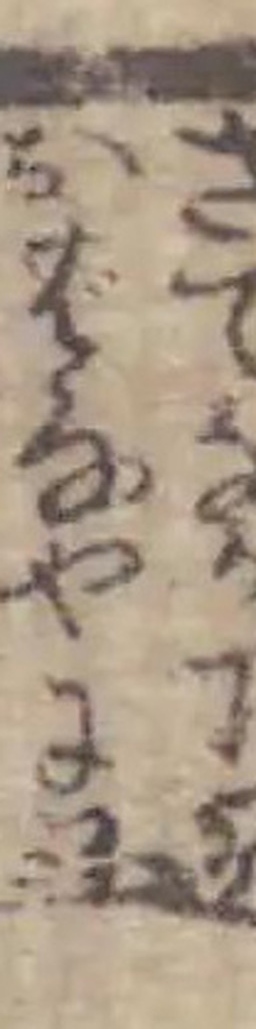おばなやに
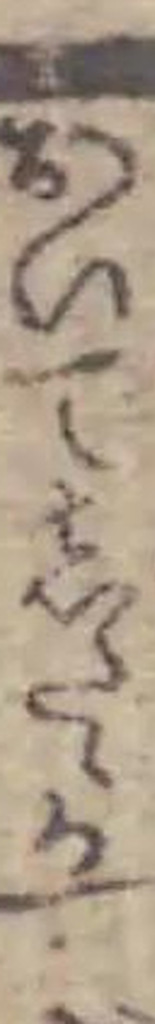おいてしたたる
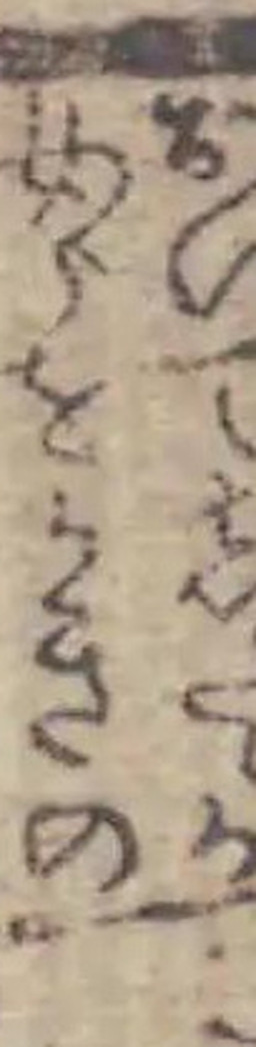女郎をかきの
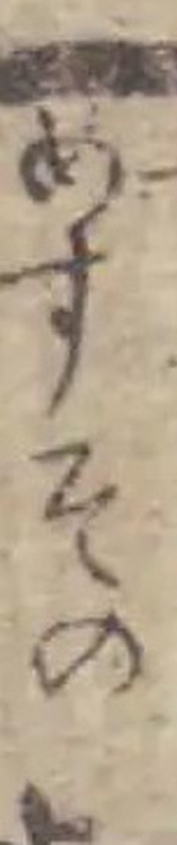めすその
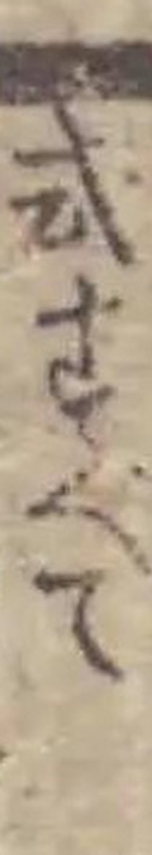式すへて
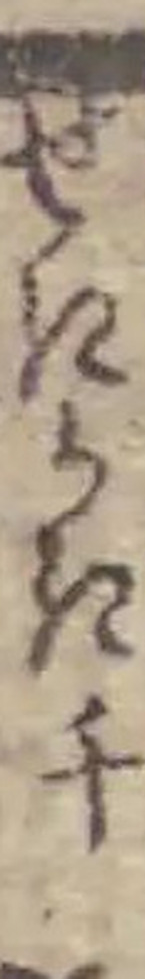せきかき千
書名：色男其処此処 3巻
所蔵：国立国会図書館 National Diet Library, JAPAN
